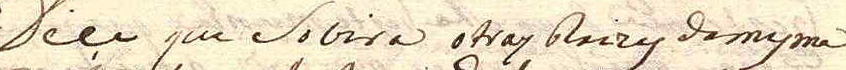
Diçe que so vira otras Raizes da mesma
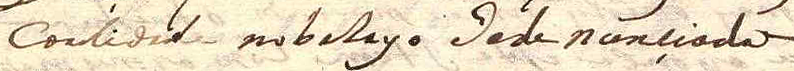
coalidade no balayo da denunçiada
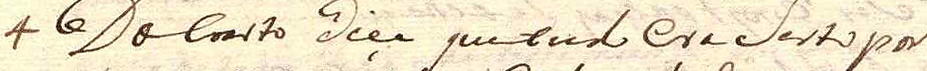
4 Do coarto diçe que tudo era serto por
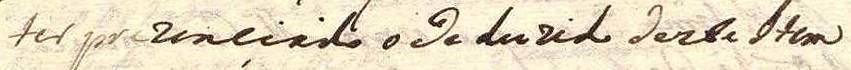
ter prezençiado o deduzido dezte Item
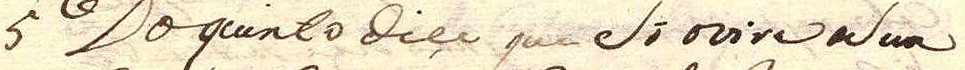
5 Do quinto diçe que só ovira a sua
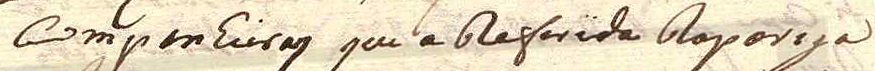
companheiras que a Referida Rapariga
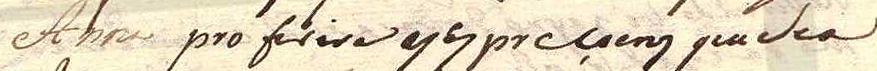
Anna proferira as espreçoens que se a
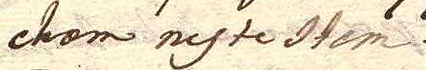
cham neste Item
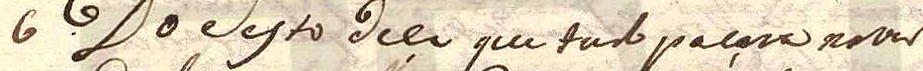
6 Do sesto diçe que tudo paçava na ver
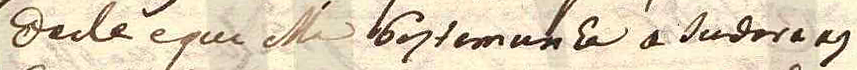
dade e que ella testemunha aIudara as
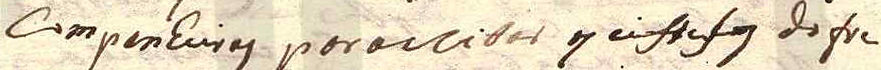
companheiras para euitar os eissesos do fre
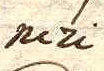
nezi
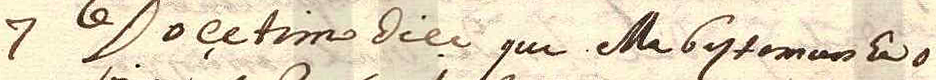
7 Do çetimo diçe que ella testemunha o
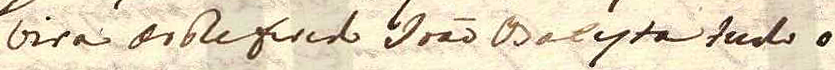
vira ao Referido Ioaõ Batista tudo o
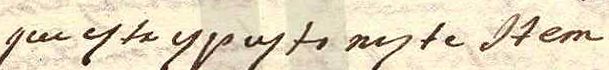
que esta espusto neste Item
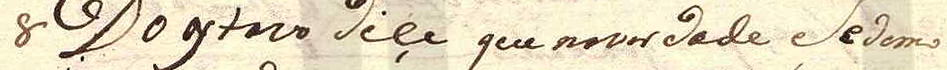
8 Do oytavo diçe que na verdade se demo
